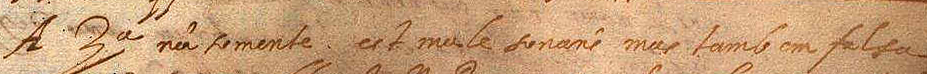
A 3a nā somente est male sonans mas tambem falsa
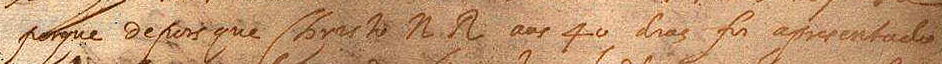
porque depois que Christo N R aos 40 dias foi apresentado
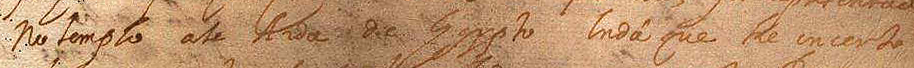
No templo ate A ida de Egypto Inda que he incerto
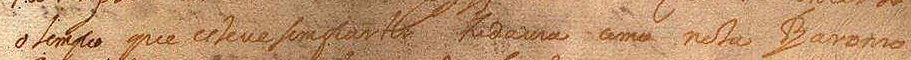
o tempo que esteue sem partir todauia como nesta Baronio
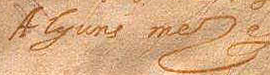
Alguns mezes
